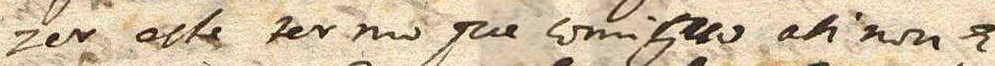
zer este termo que comiguo asinou E
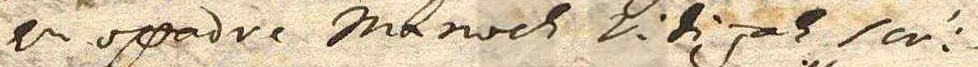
Eu o padre manoel Vidigal scri
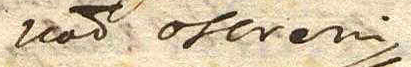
uaõ o screui.
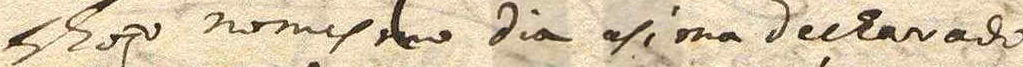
E logo no mesmo dia asima declarado
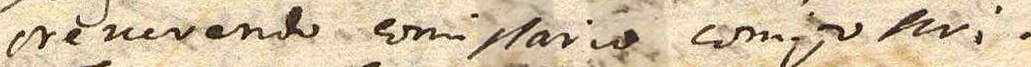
o reuerendo comissario comigo scri
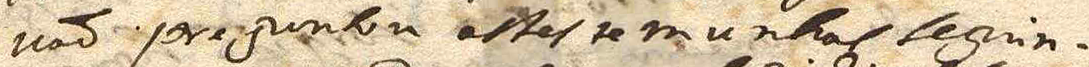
uão preguntou as testemunhas seguin
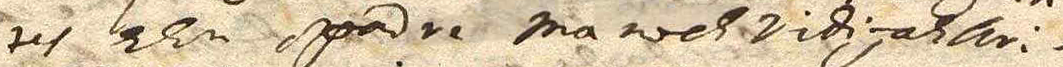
tes E Eu o padre manoel Vidigal scri
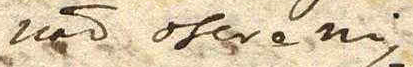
uaõ o escreui.
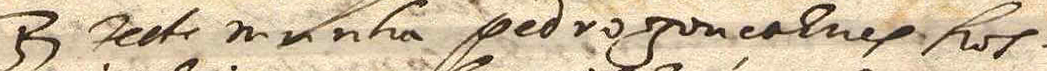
item testemunha pedro gonçalues hos
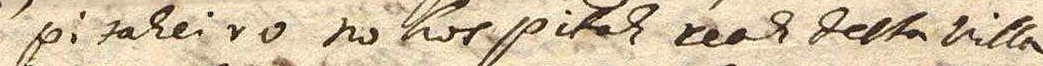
pitaleiro no hospital real desta villa
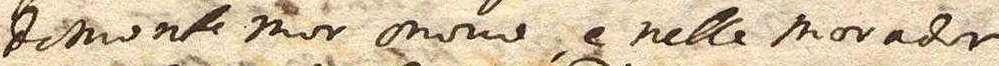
de montemor o nouo, e nelle morador
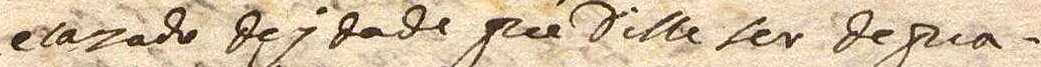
e cazado de jdade que disse ser de qua
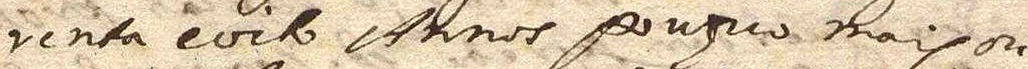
renta e oito Annos pouquo mais ou
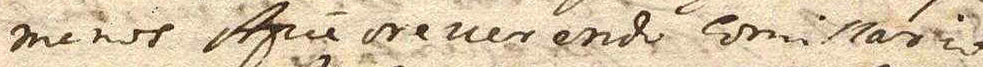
menos A quē o reuerendo comissario
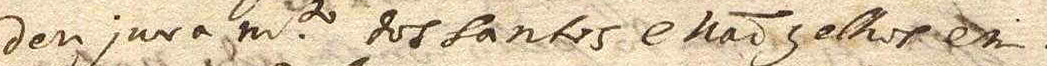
deu juram.to dos santos euãogelhos em
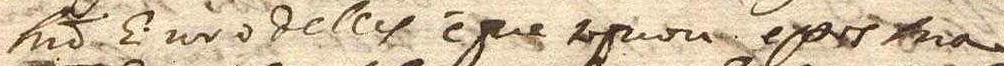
hū liuro delles ē que toquou e pos sua
